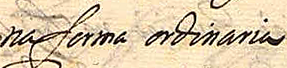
na forma ordinaria
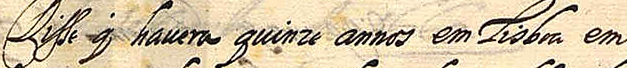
Disse q̄ hauera quinze annos em Lisboa em
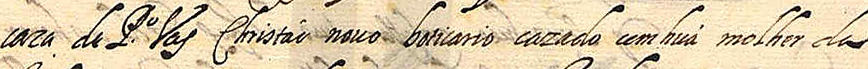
caza de P.o Vas Christaõ nouo boticario cazado com huā molher da
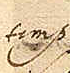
temp.
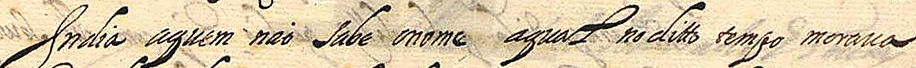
Jndia a quem naõ sabe o nome, a qual no ditto tempo moraua
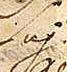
Lug.
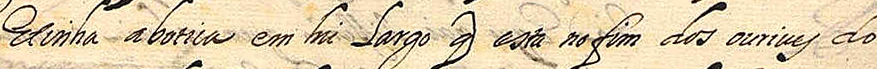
E tinha a botica em hū Largo q̄ esta no fim dos ouriues do
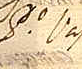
P.o Vas
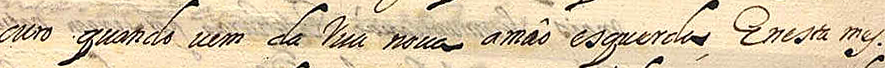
ouro quando uem da Rua noua a maõ esquerda, E nesta mes
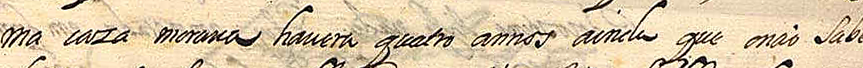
ma caza moraua hauera quatro annos ainda que o naõ Sabe
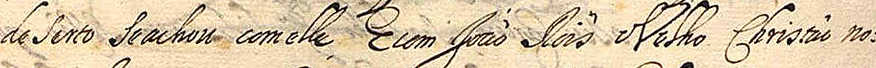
de Serto Se achou com elle, E com Joaõ Rois̄ o Velho Christão no
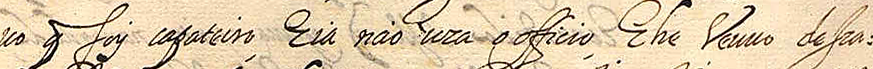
uo q̄ foy capateiro, E ia não uza o officio, E he Veuuo de Jza
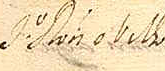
I.o Rois̄ o Velho
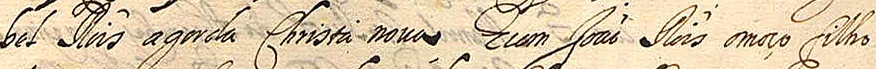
bel Rois̄ a gorda Christā noua, E com Joaõ Rois̄ o moço filho
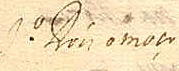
J.o Rois̄ o moço
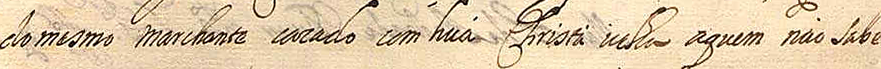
do mesmo marchante cazado com huā Christā uelha a quem naõ Sabe
